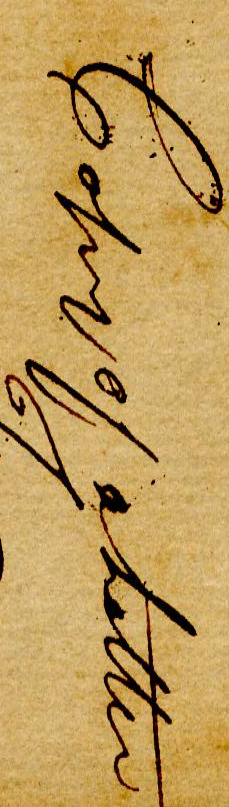Copy of a Letter
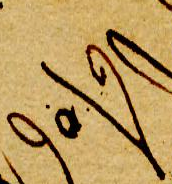To
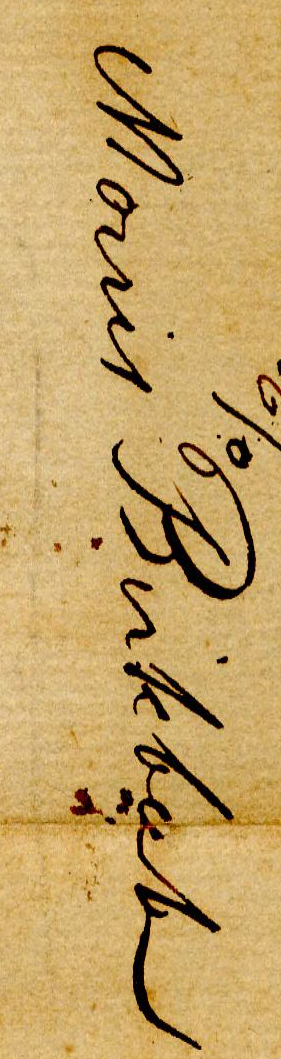Morris Birkbeck
